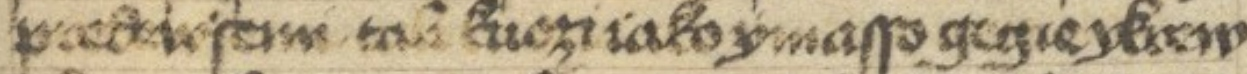predewẛemi tak knezi iako ymaſſo gegie ykrew
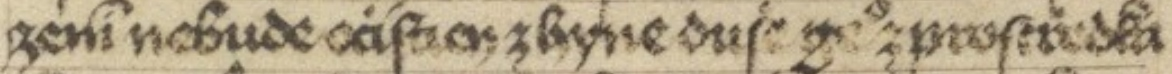zenȋ nebude očiſtien zhyne duẛe ge° z proſtṙedka
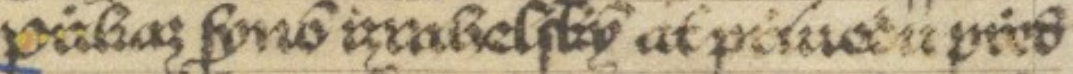Pṙikaz ſynȏ izrahelſkŷ at pṙiuedu pṙed-
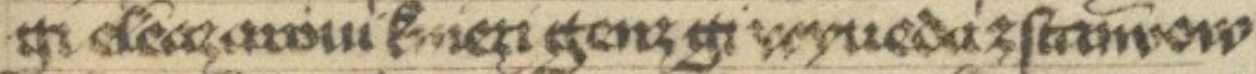gi eleazaroui kniezi genz gi wyueda zſtanvow
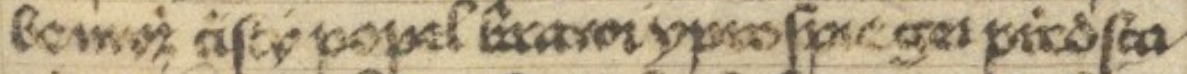be mvż ċiſty popel krawi yproſpiegei pṙedſta-
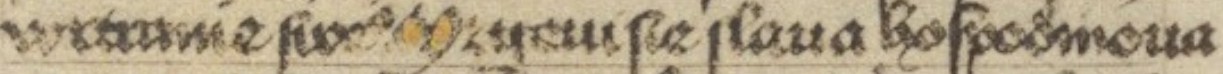wrtranie ſwe° Yzgeui ſie ſlaua hoſpodinoua
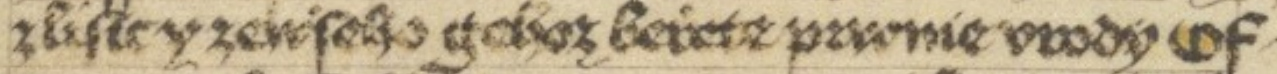zliſte y zewẛeho gehoz berete prwnie vrody Of-
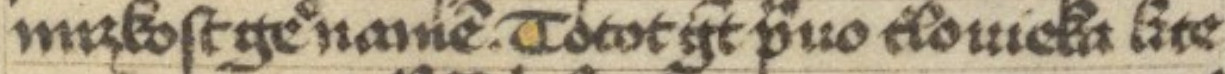mrzkoſt ge° naniȇ. Totot g̑t p̈uo ċlouieka kte
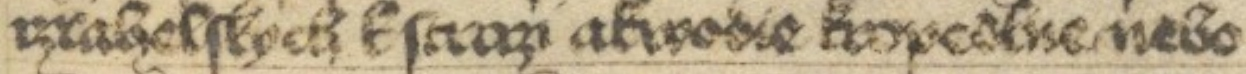izrahelſkych k ſtrazi akwodie kropedlne nebo
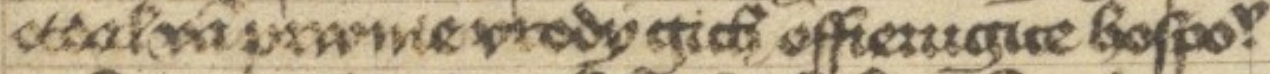otdalenȋ prwnie vrody gich offierugice hoſpo.v
